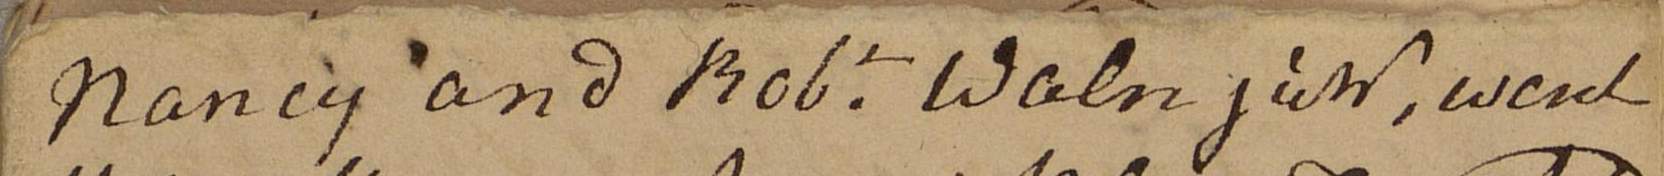Nancy and Rob^t. Waln jun^r, went
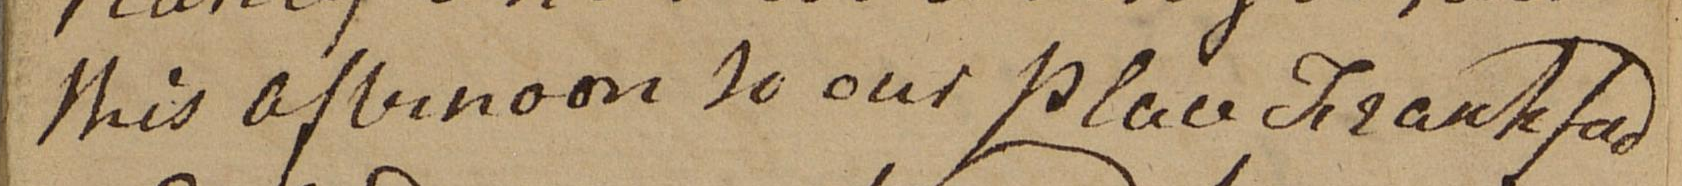this afternoon to our place Frankfad
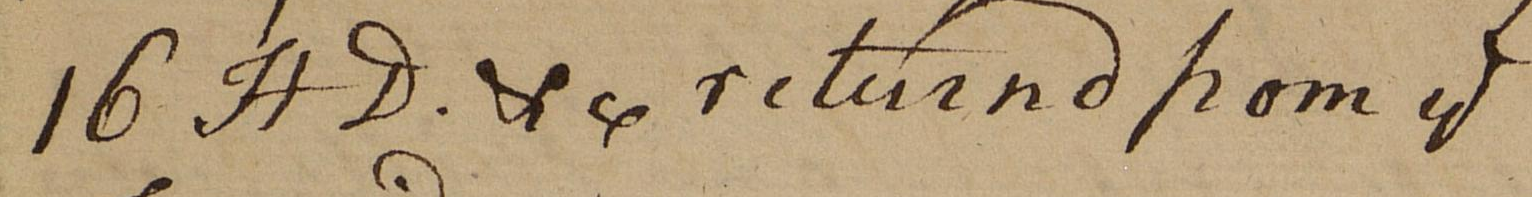16 H D. &c returnd from y^e
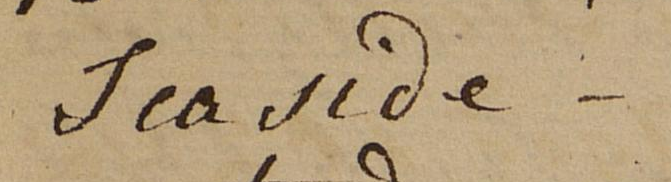Sea side-
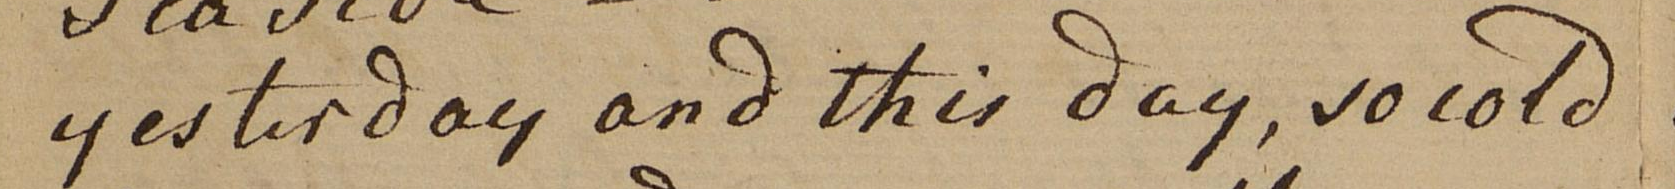yesterday and this day, so cold
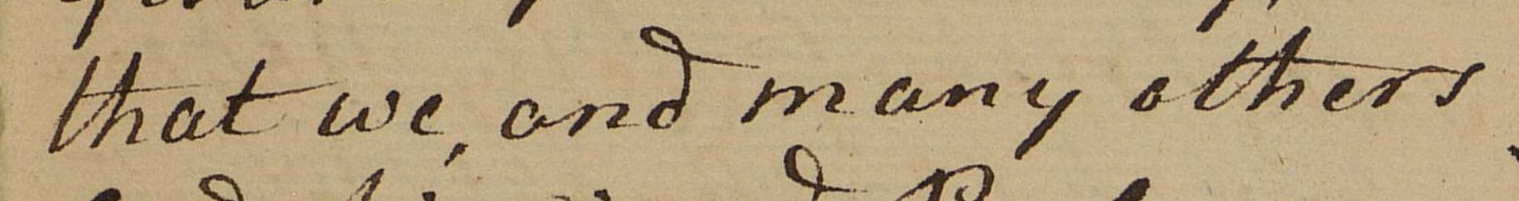that we and many others
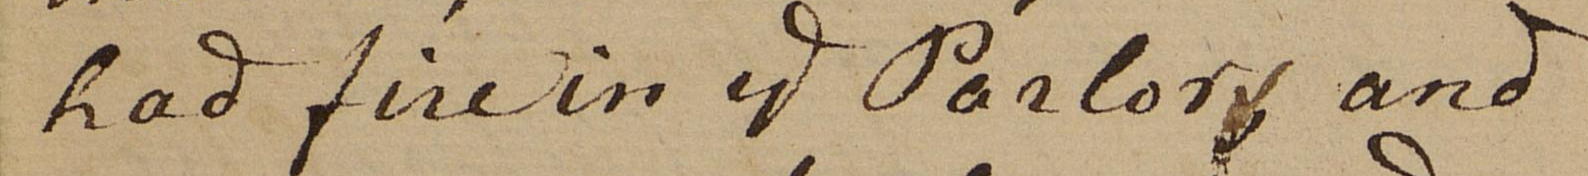had fire in y^e Parlors and
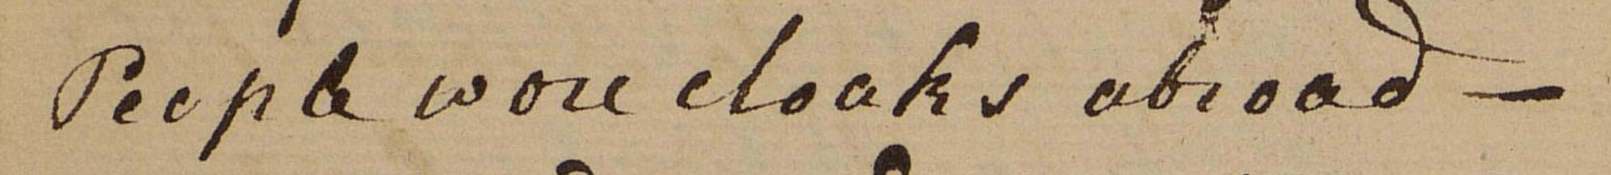People wore cloaks abroad-
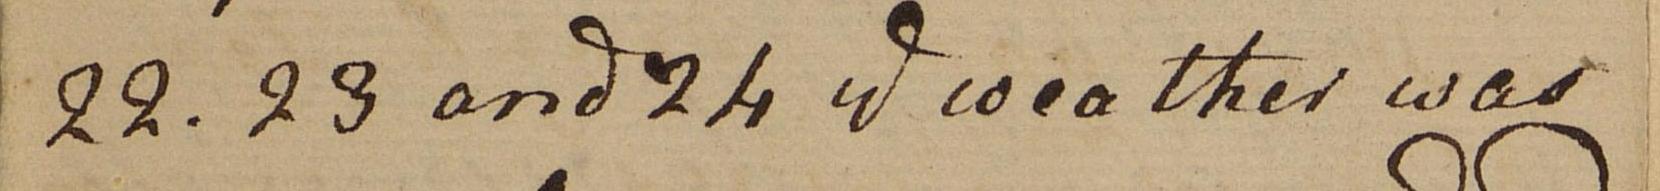22. 23 and 24 y^e weather was
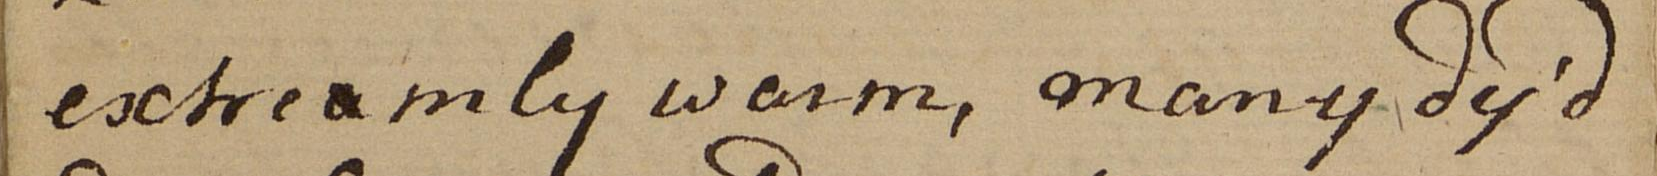extreamly warm, many dy'd
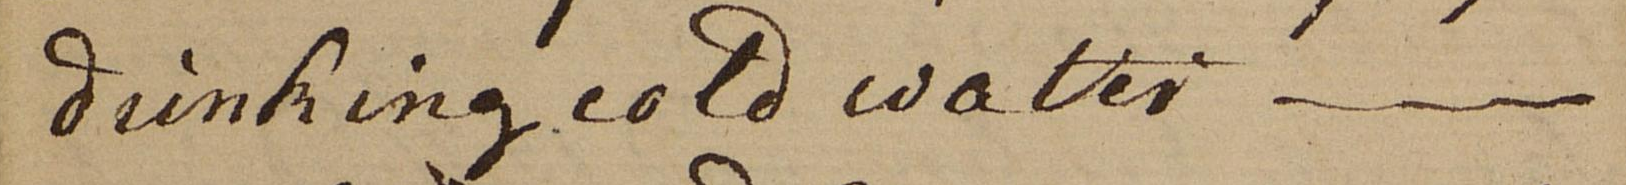drinking cold water-
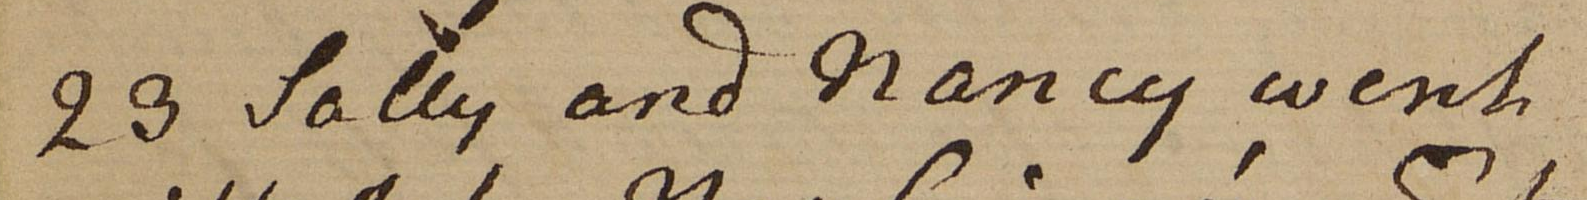23 Sally and Nancy went
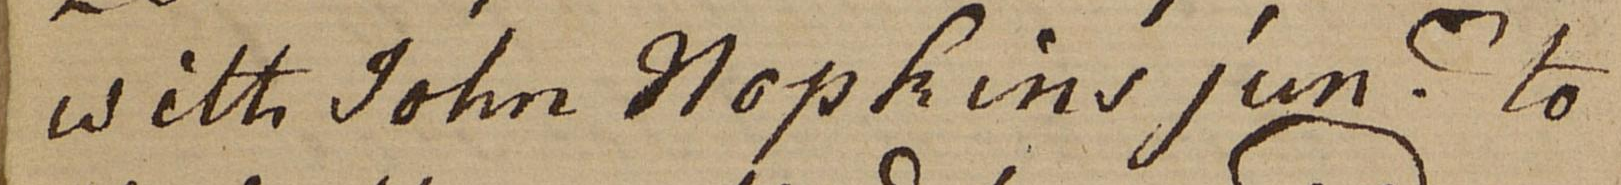with John Hopkins jun^r. to
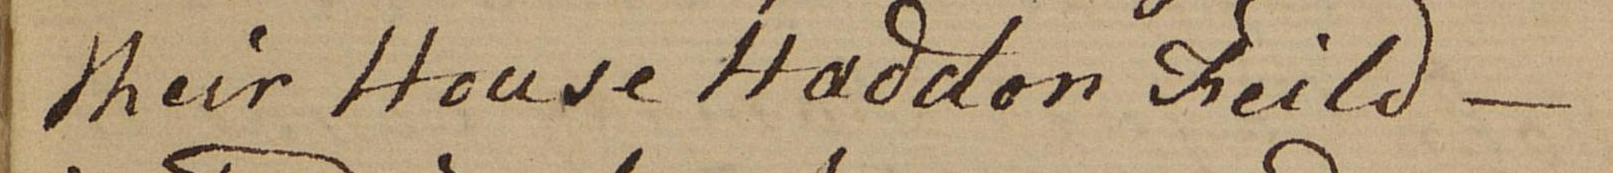their House Haddon Feild-
